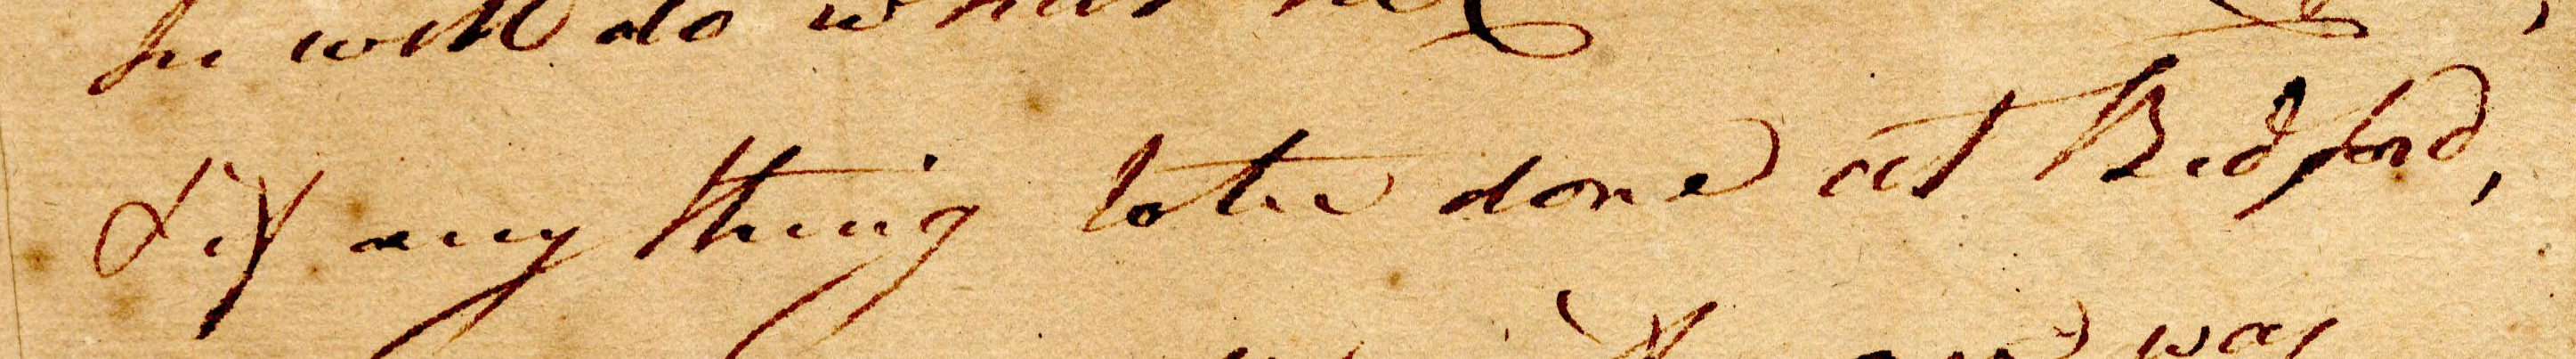& if any thing to be done at Bedford,
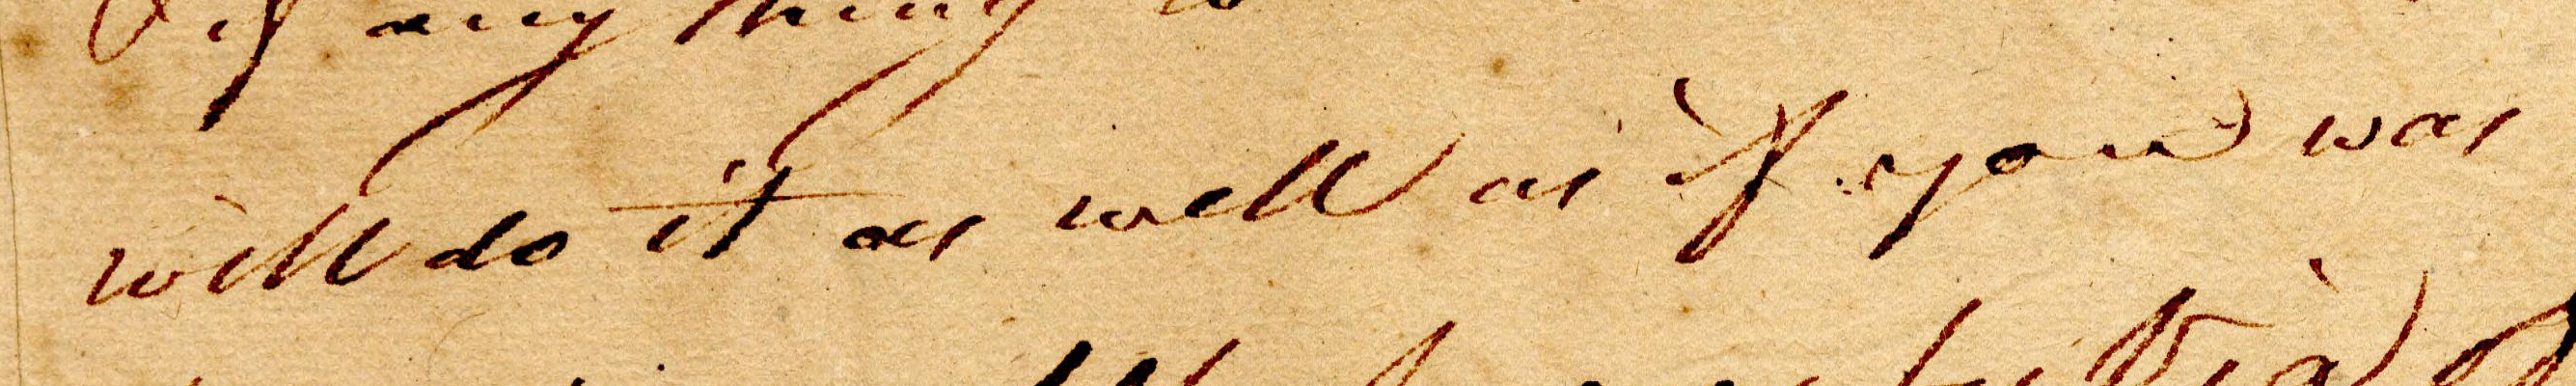will do it as well as if you was
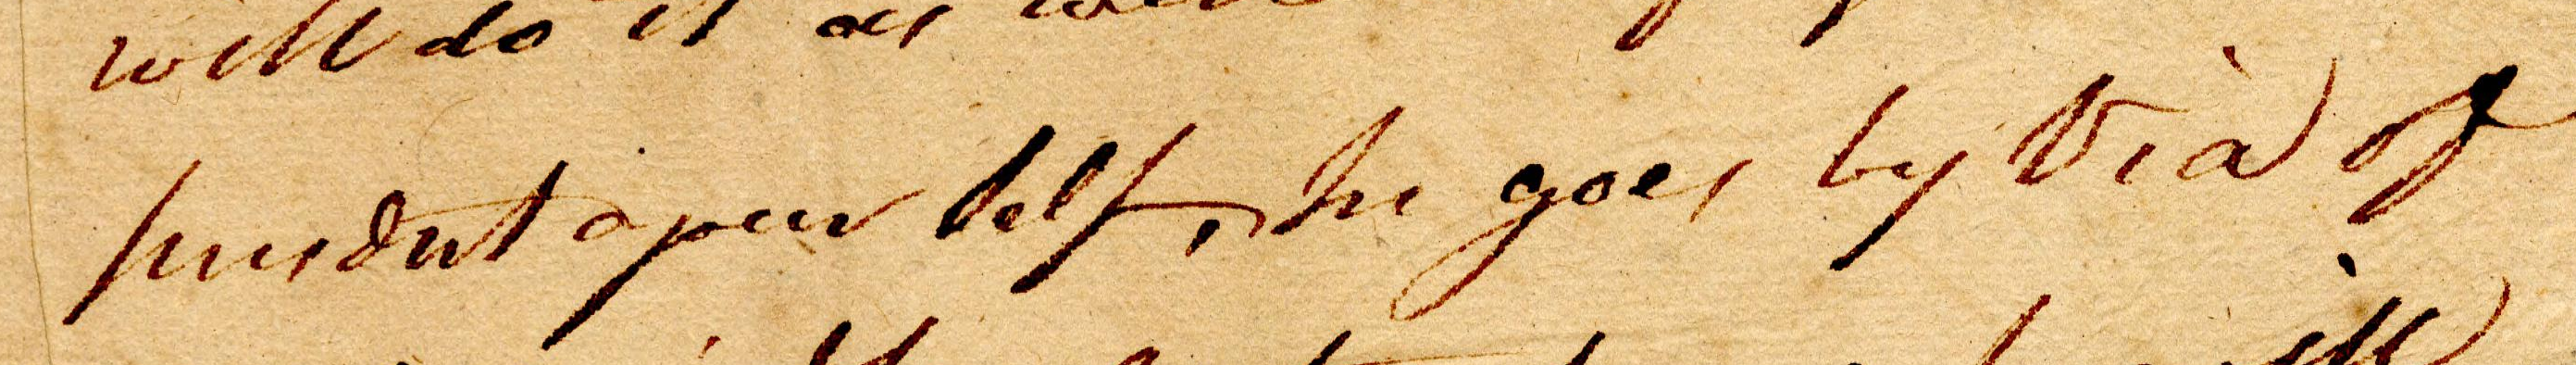present your self, he goes by Via of
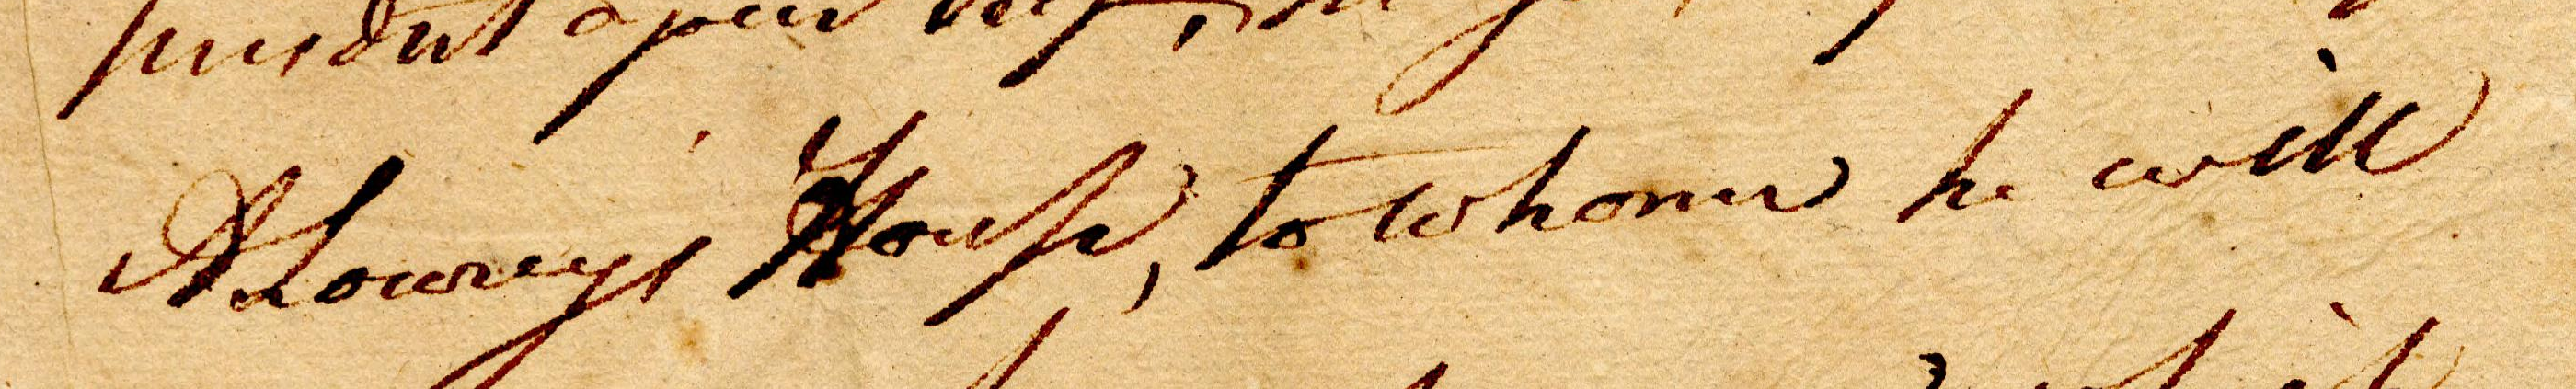A Lowreys House, to whom he will
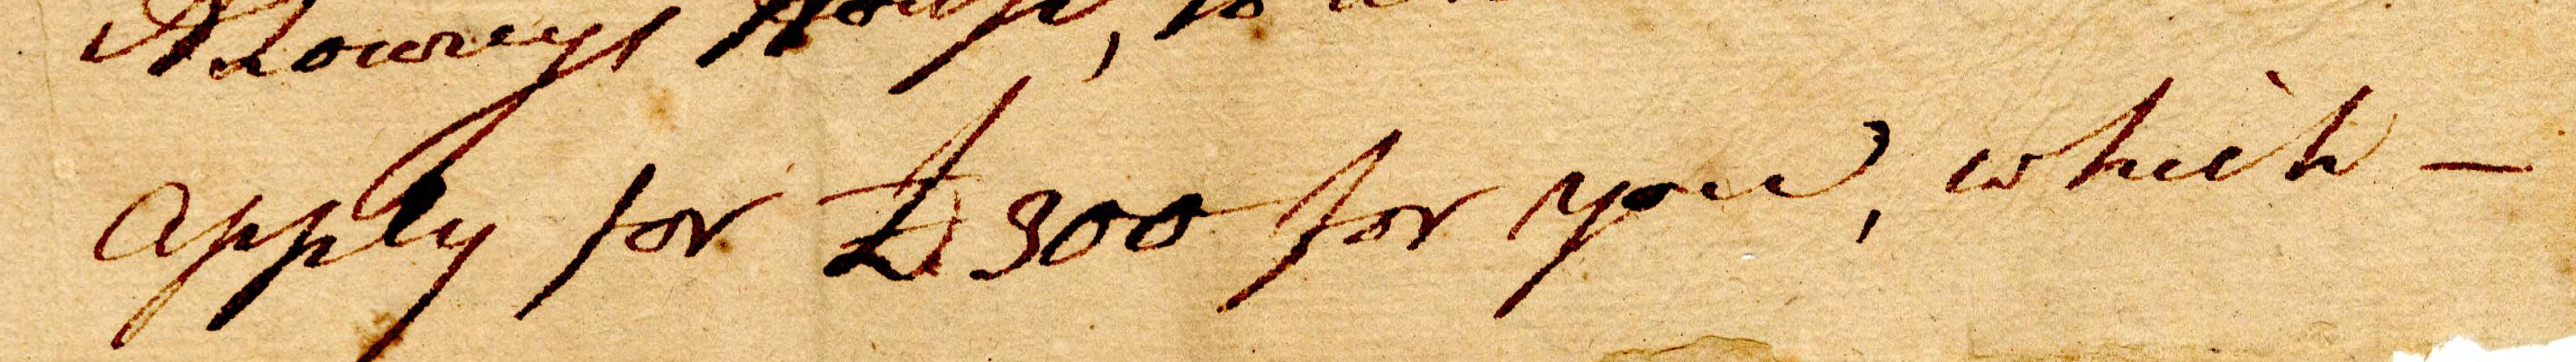apply for £300 for you, which-
